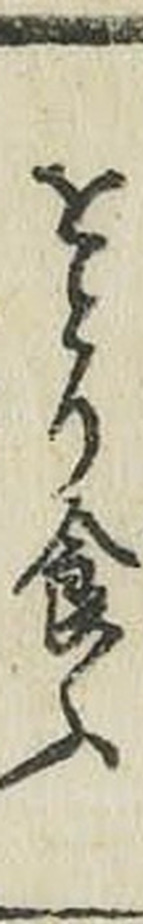をとり食ふ
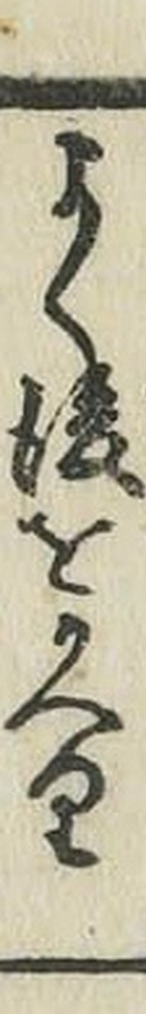よく後をかへり
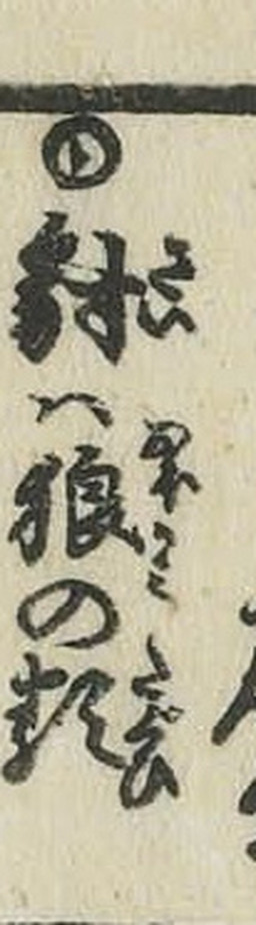○豺は狼の類
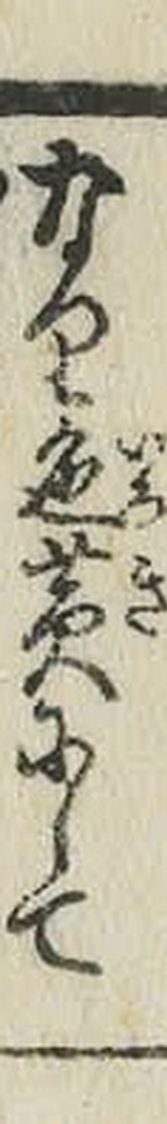なり色黄にして
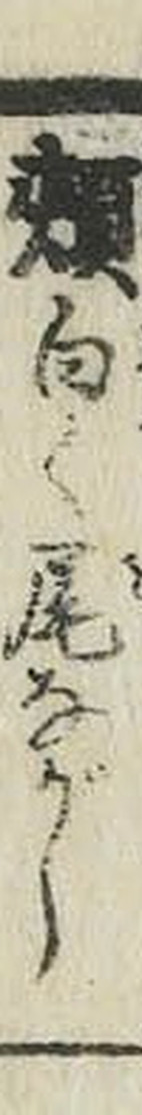頬白く尾ながし
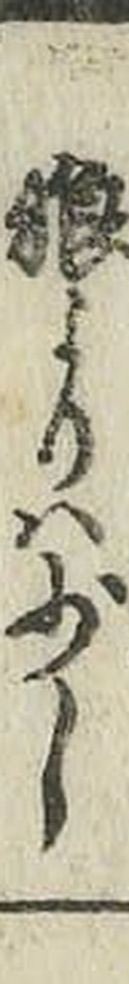狼よりは少し
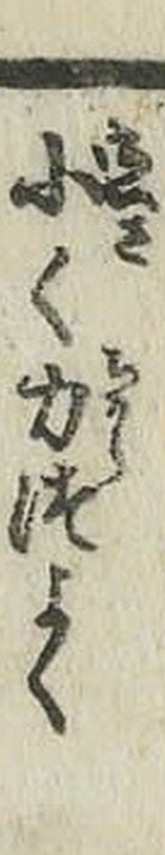小く力つよく
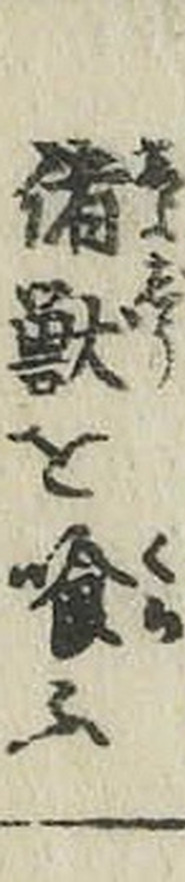諸獣を喰ふ
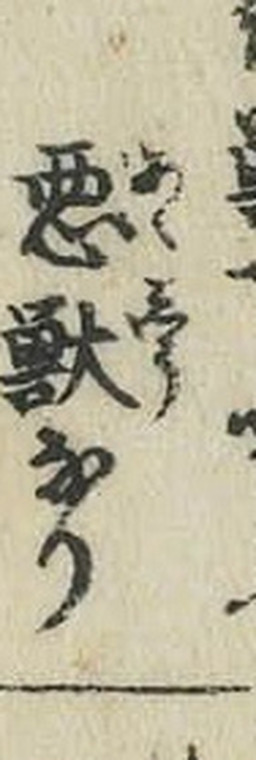悪獣なり
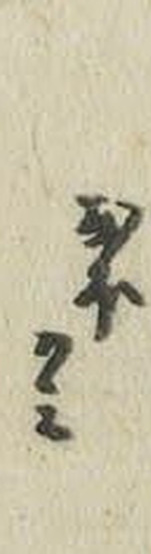おほかみ
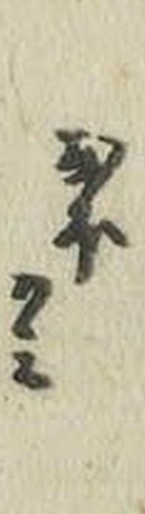おほかみ

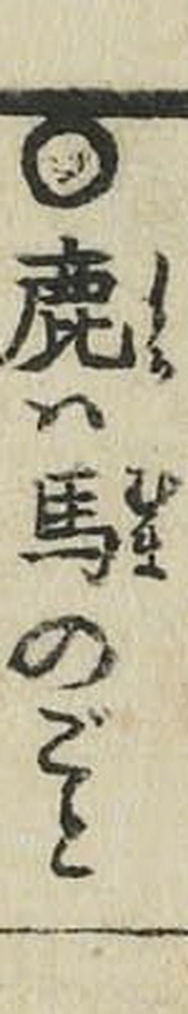○鹿は馬のごと
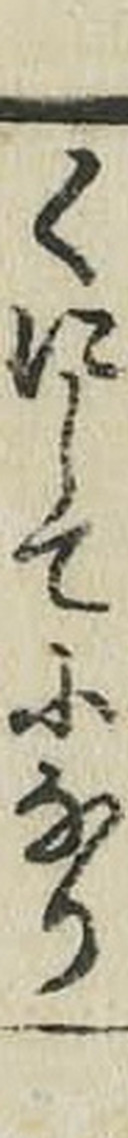くにして小なり
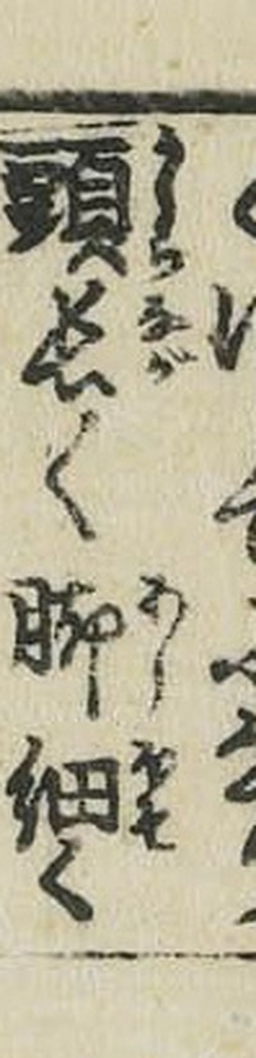頭長く脚細く
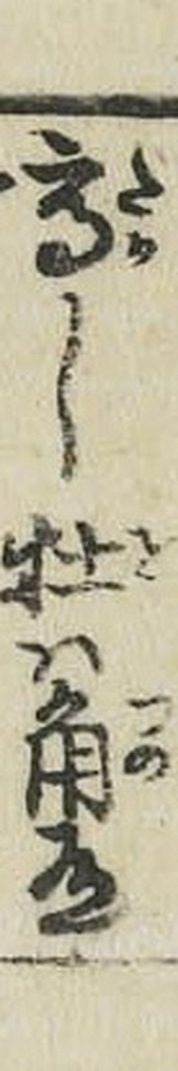高し牡は角有
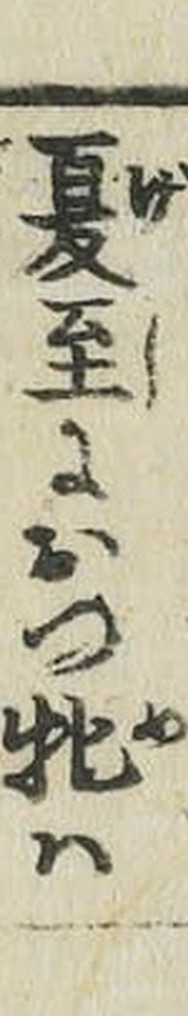夏至におつ牝は
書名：増補頭書訓蒙図彙大成 10巻 6:巻之12-13
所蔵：東京学芸大学教育コンテンツアーカイブ
